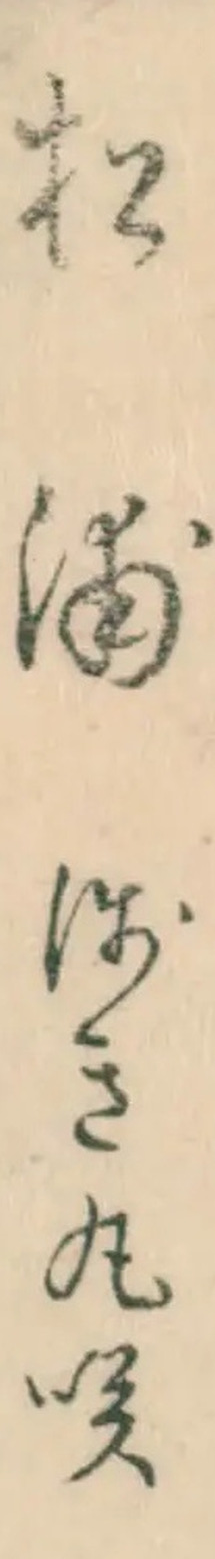松浦浅き丸咲
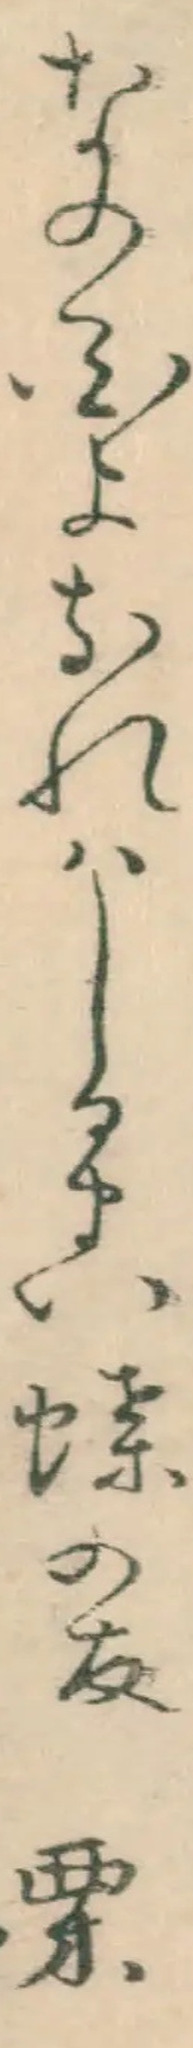なの花よなれハしるまい蝶の友栗
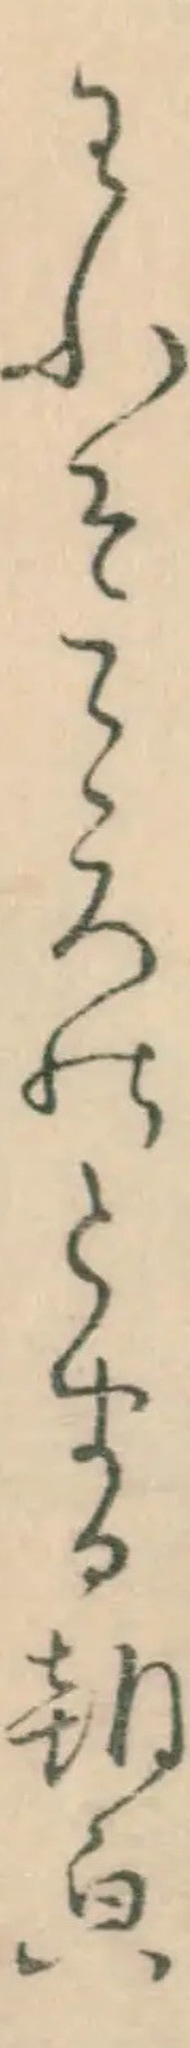われそこゝろのとまる朝貌間戸

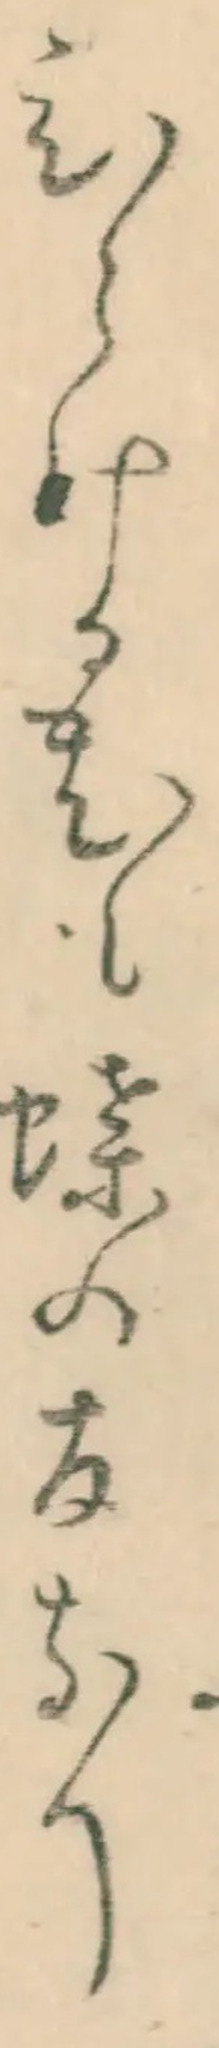ひらける花も蝶の友なり
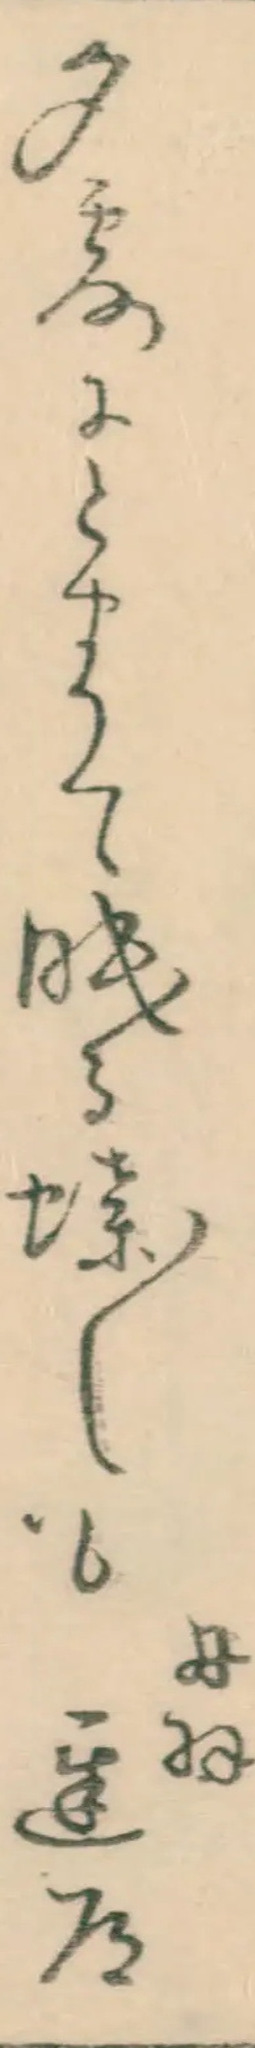夕處にとまりて眠る蝶〳〵も丹羽
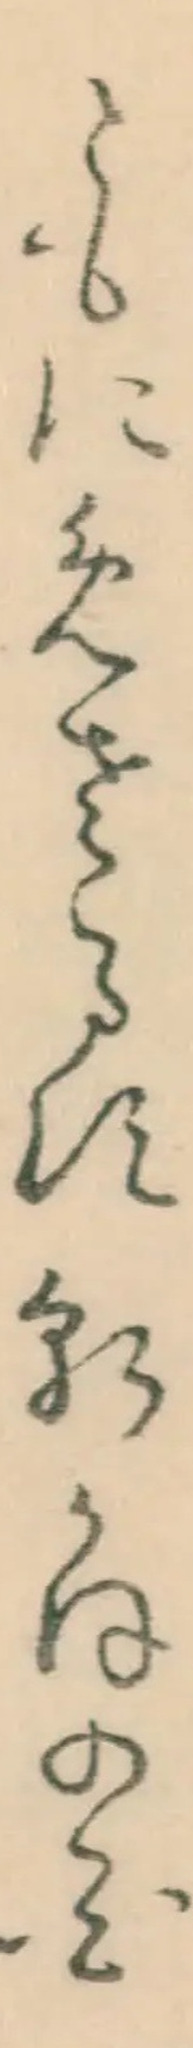ともにめさます朝かほの花達道
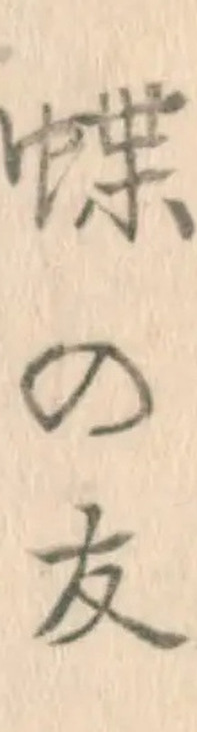蝶の友

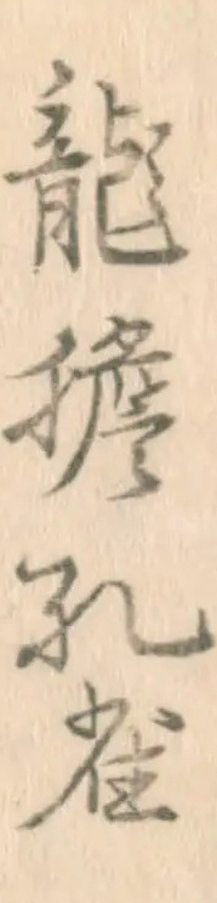龍膽孔雀
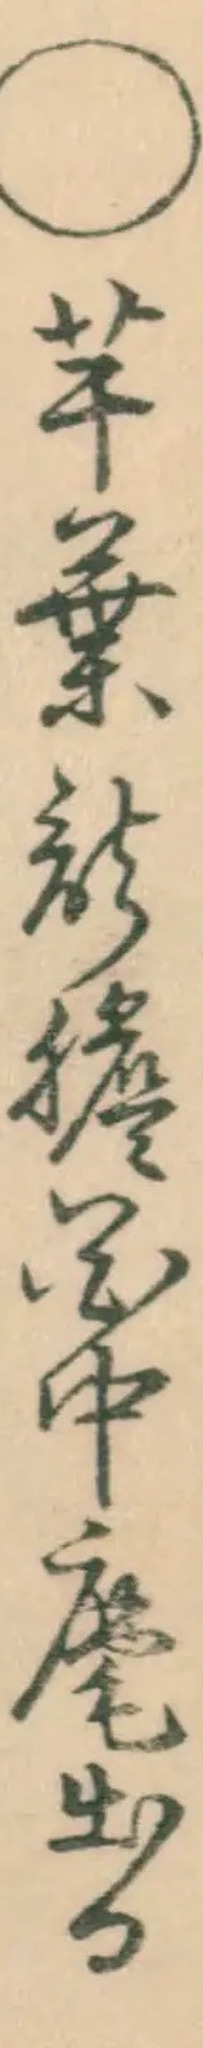〇芋葉龍膽花中麾出る
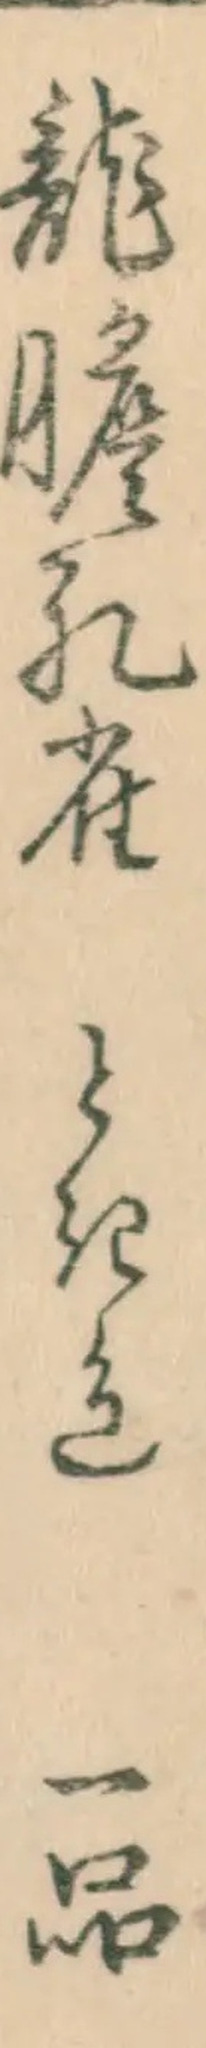龍膽孔雀とき色一品
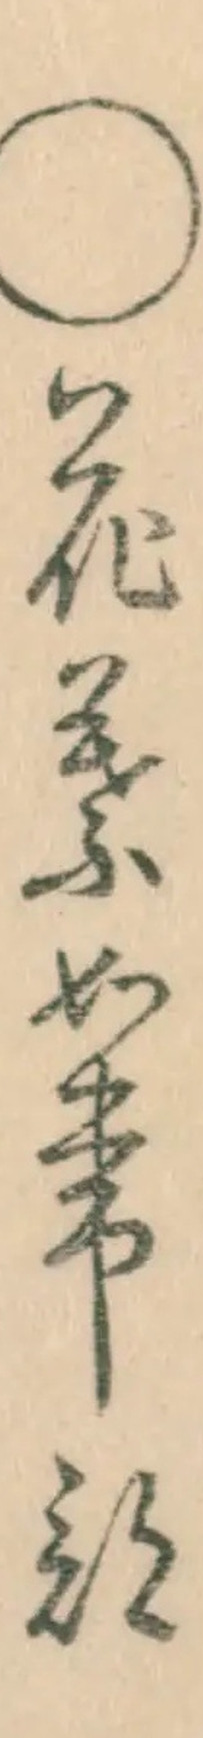〇花葉如韋部
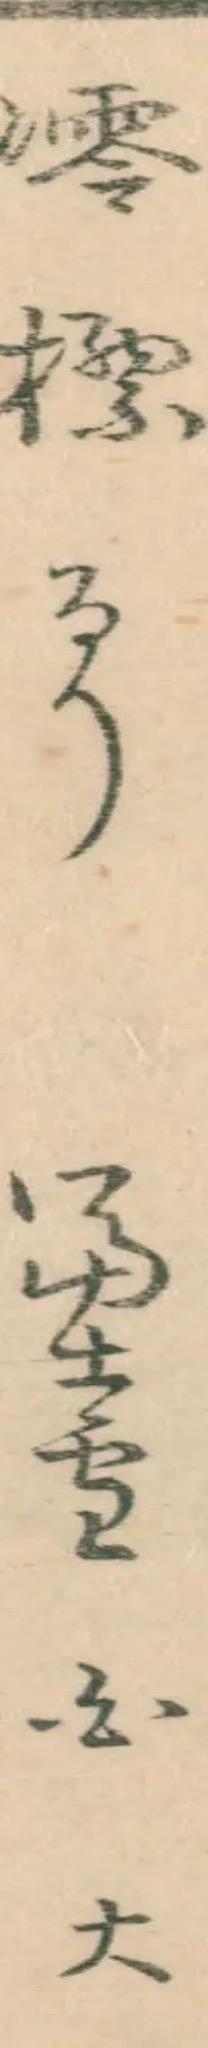澪標るり富士雪花大
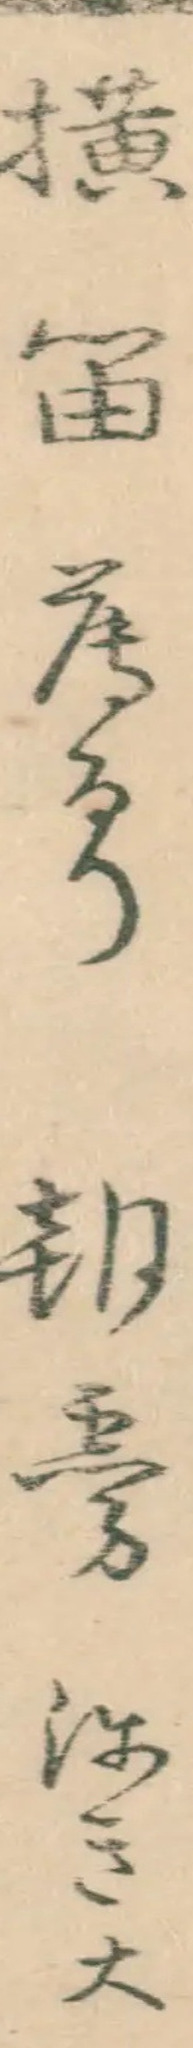横笛薄るり朝霧浅き大
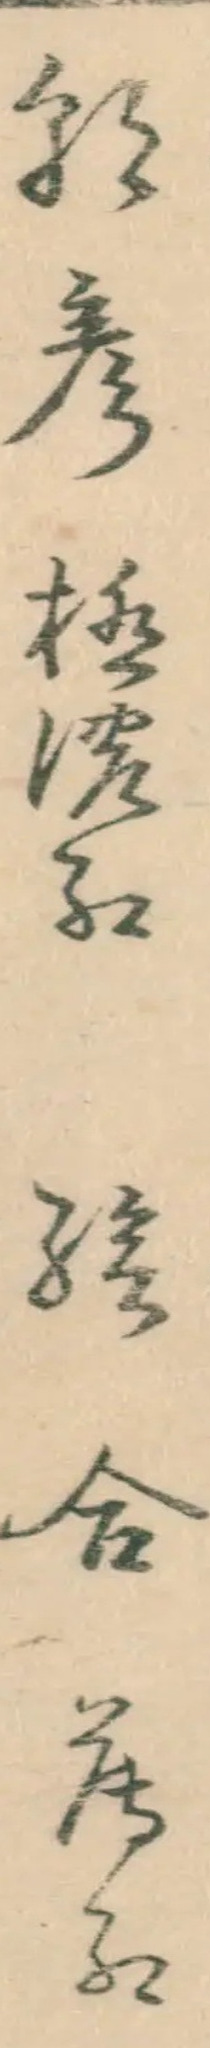朝彦極濃紅結合薄紅
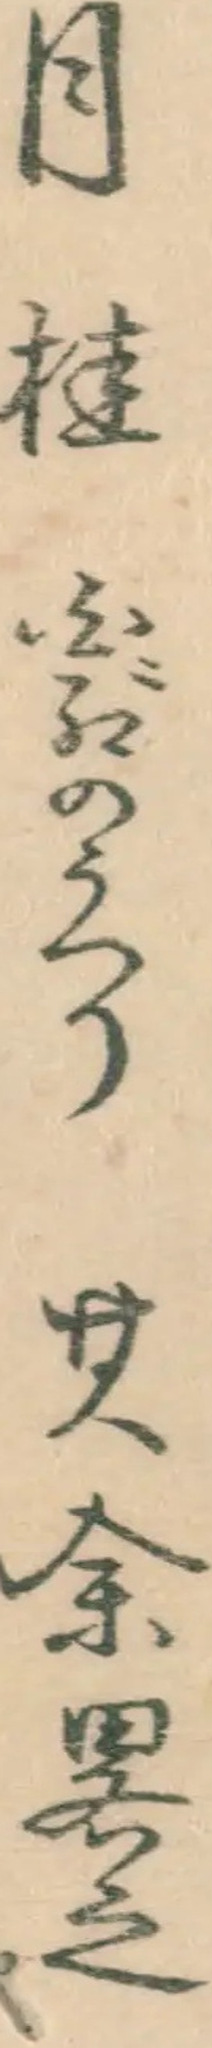月桂花ニ紅のうつり其余略之

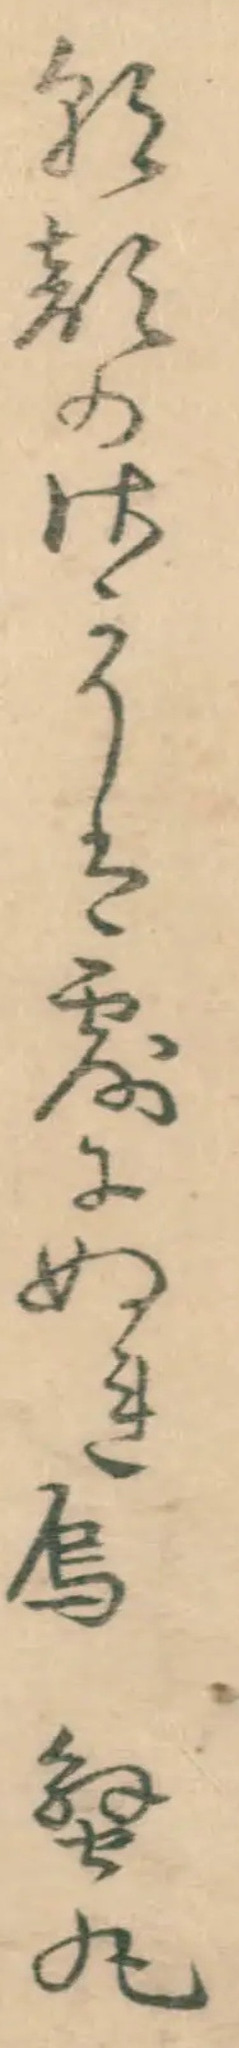朝顔のさかりは露にぬれ鳫蟹丸
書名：花壇朝顔通 2巻. [2]
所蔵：国立国会図書館 National Diet Library, JAPAN
